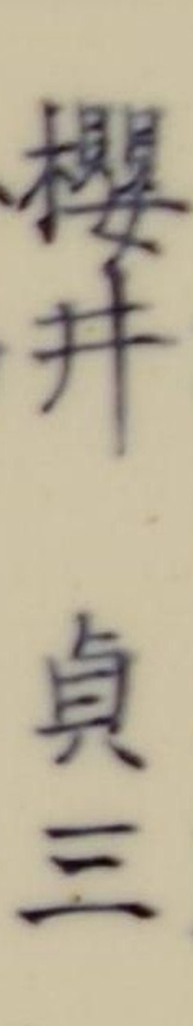桜井貞三
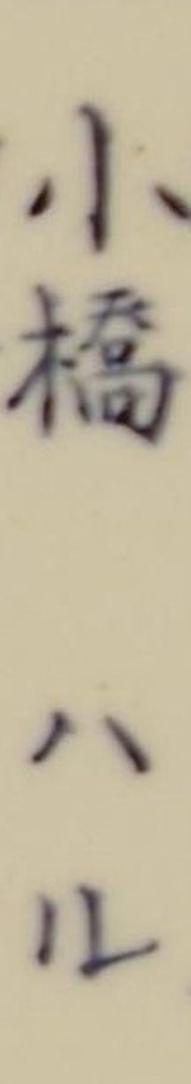小橋ハル
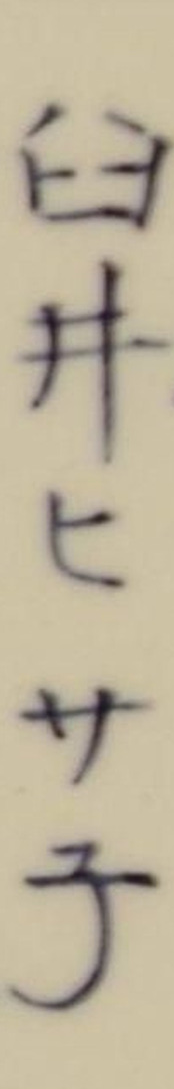臼井ヒサ子
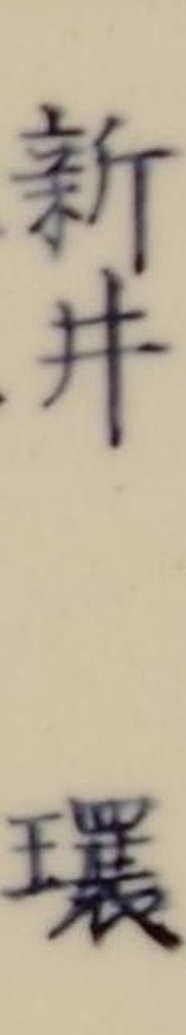新井環
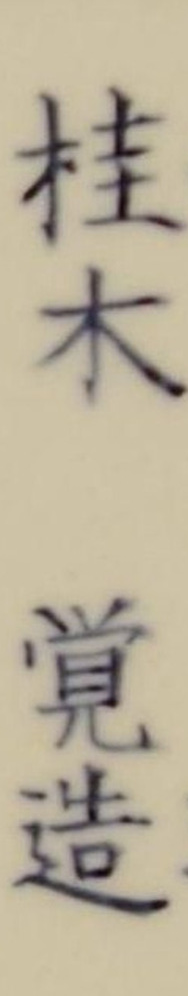桂木覚造
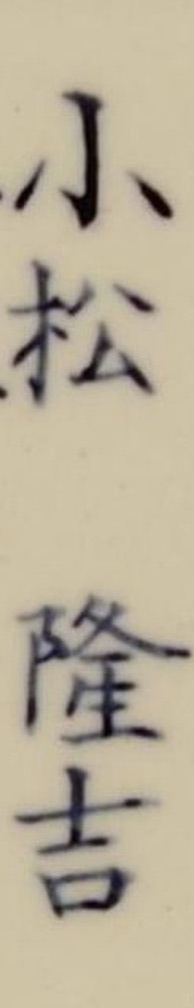小松隆吉
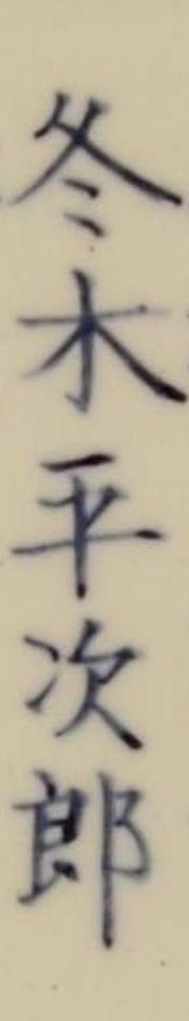冬木平次郎
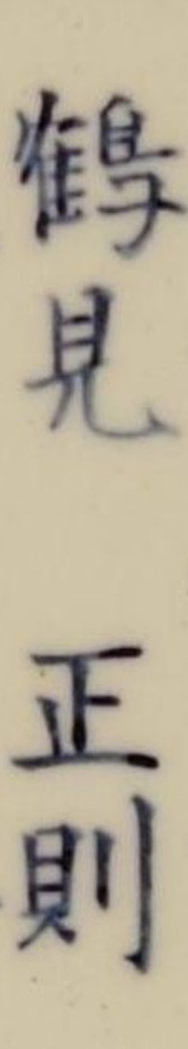鶴見正則
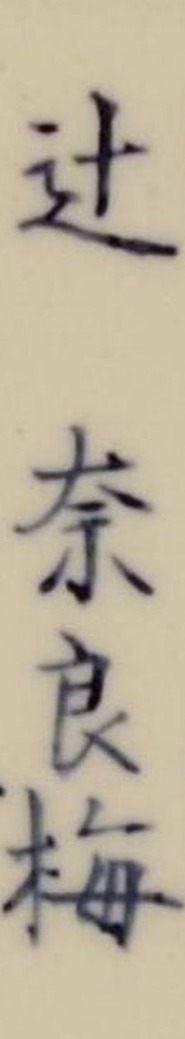辻奈良梅
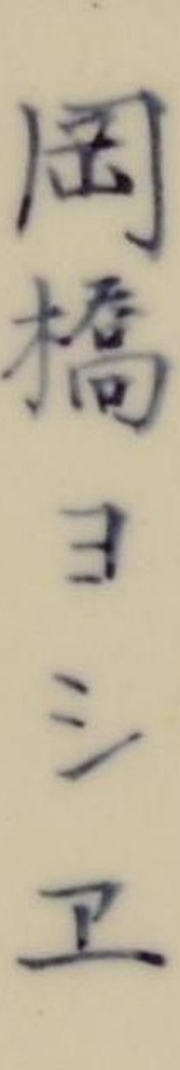岡橋ヨシヱ
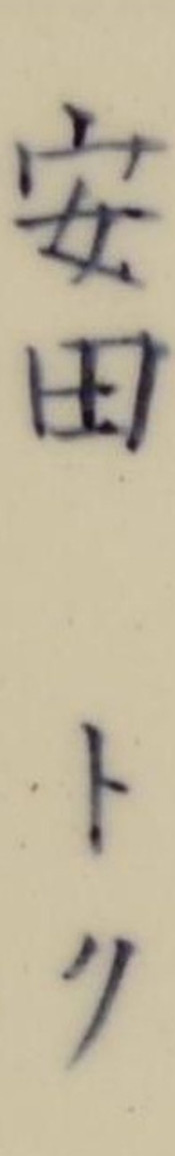安田トク
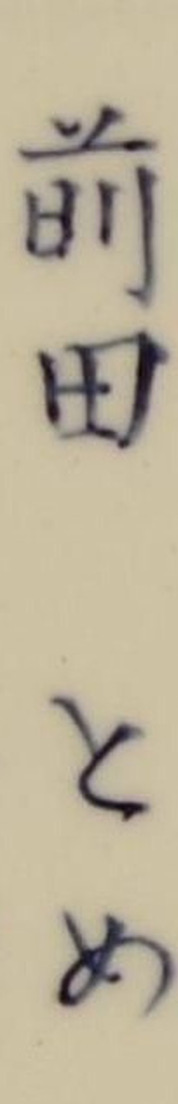前田とめ
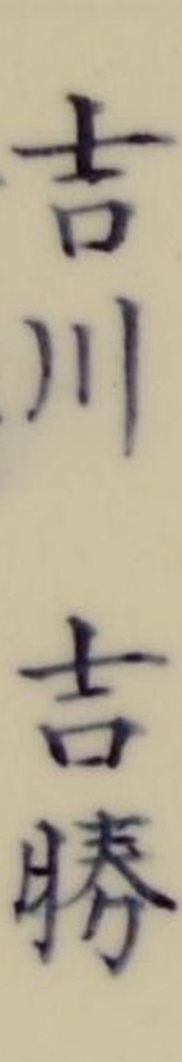吉川古勝
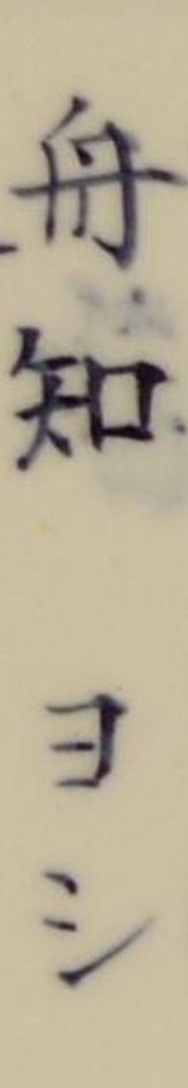舟知ヨシ
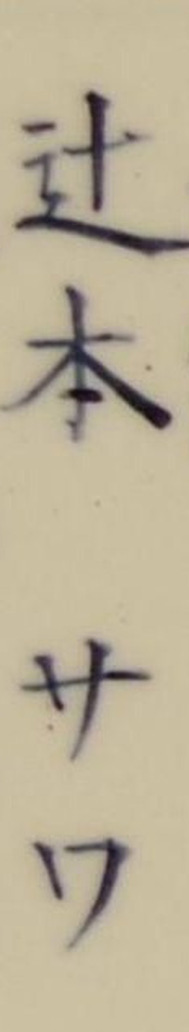辻本サワ
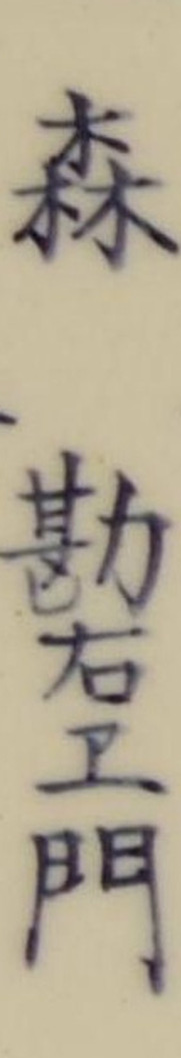森勘右エ門
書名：E~L
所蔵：高野山金剛峯寺
